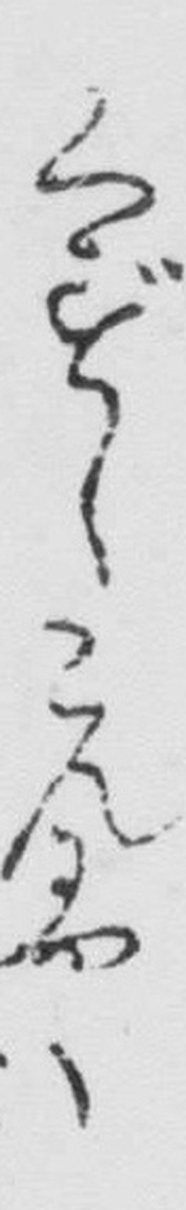くずしこんにやく
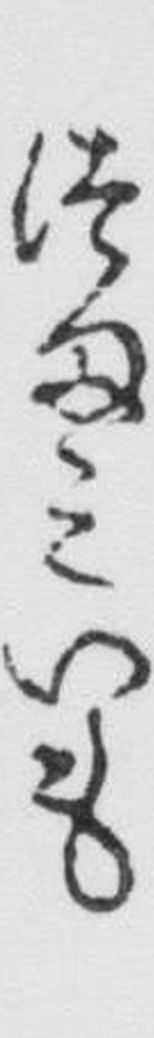つまみいも
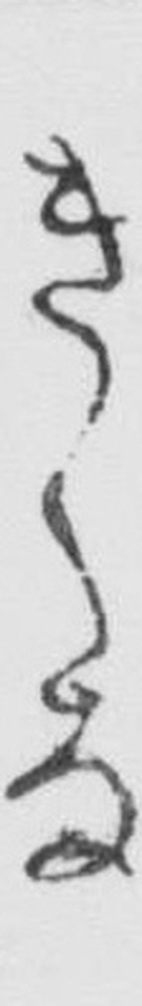きくな
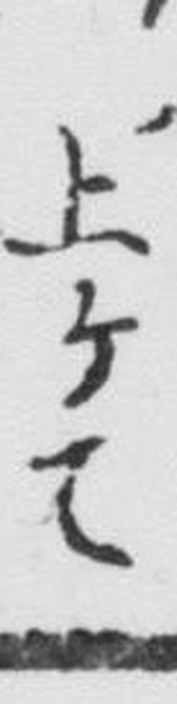上けて
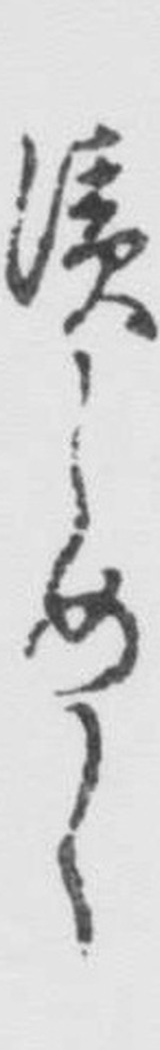漬しめし
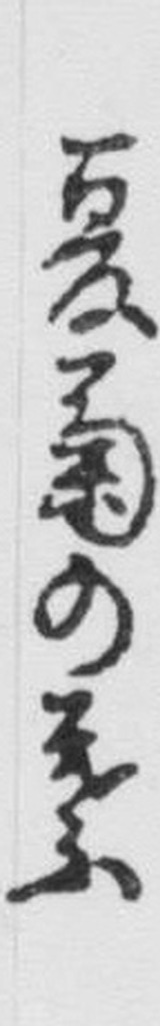夏菊の葉
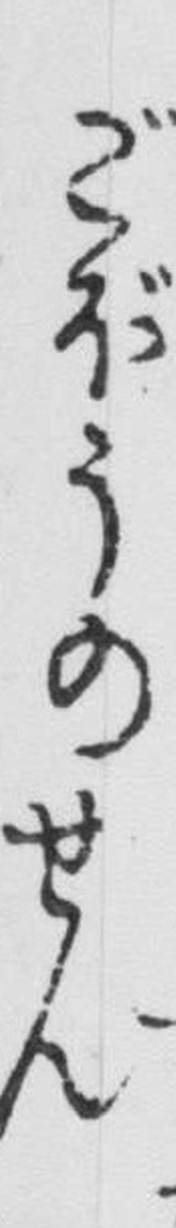ごぼうのせん
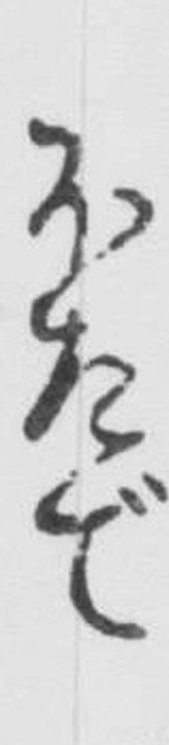ほたで

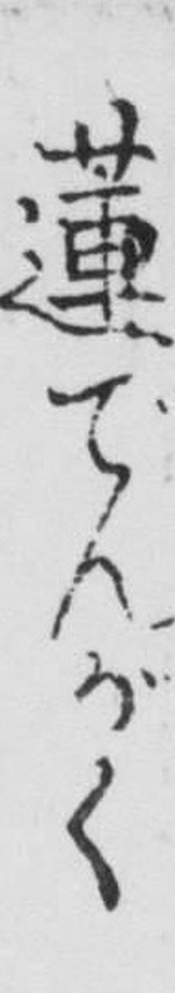蓮でんがく
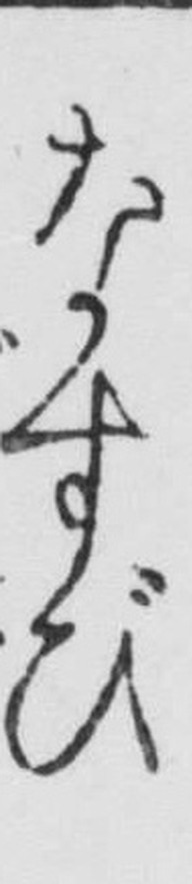なすび
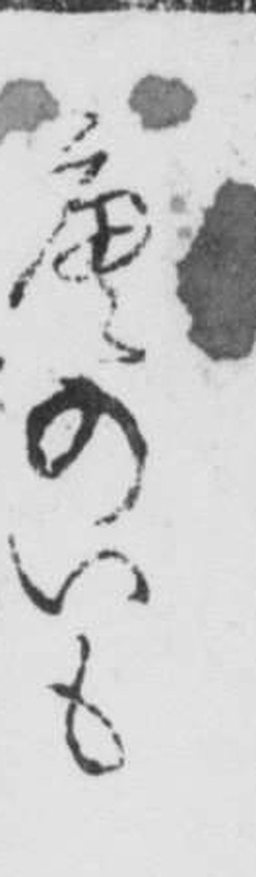唐のいも
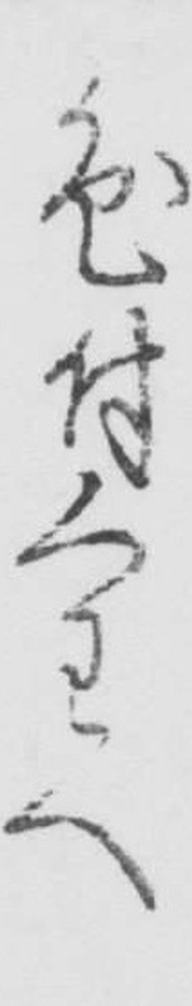色付くわへ
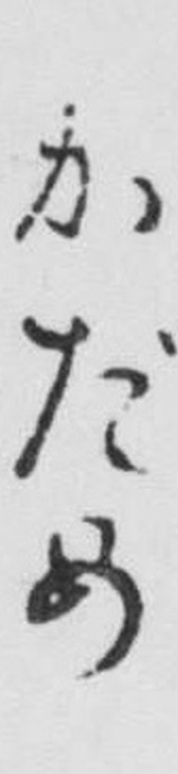かだめ
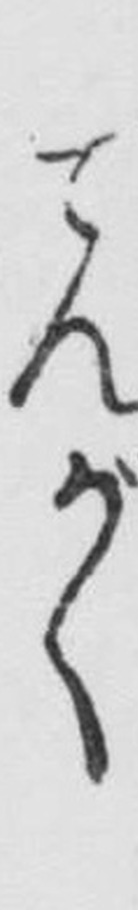でんがく
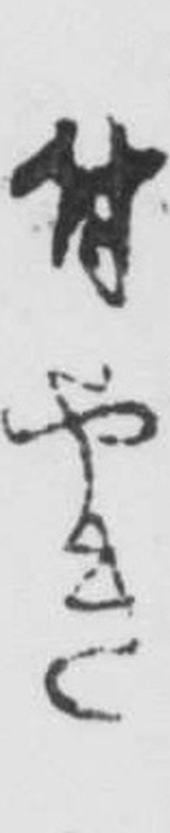付やき
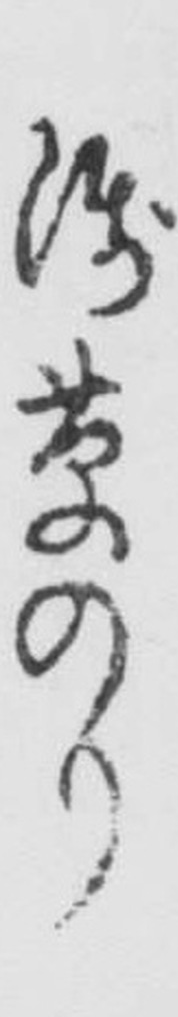浅草のり
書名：諸家通用/即席料理
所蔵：大阪府立大学学術情報センター 国文学研究資料館
